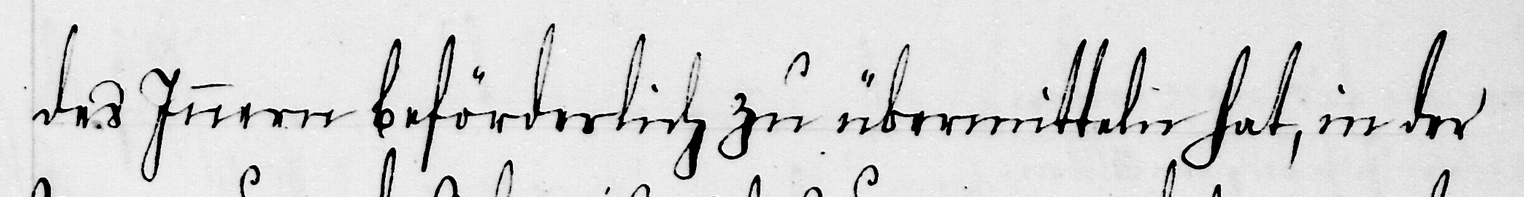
des Innern beförderlich zu übermitteln hat, in der
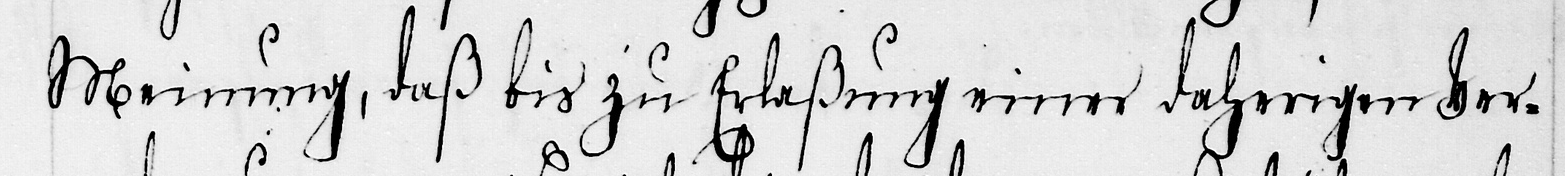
Meinung, daß bis zu Erlaßung einer daherigen Ver¬
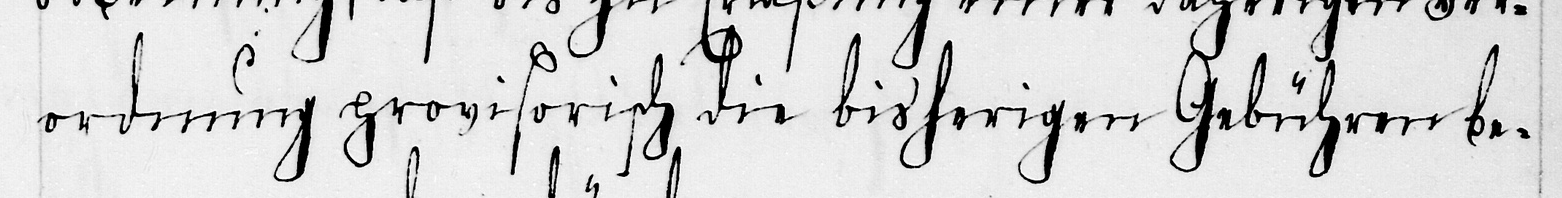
ordnung provisorisch die bisherigen Gebühren be¬
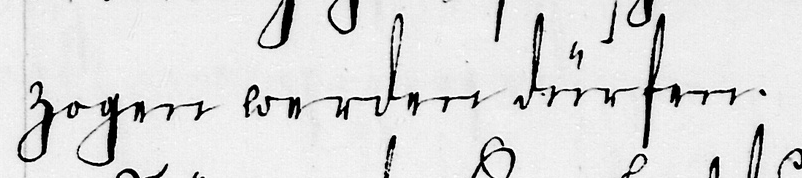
zogen werden dürfen.
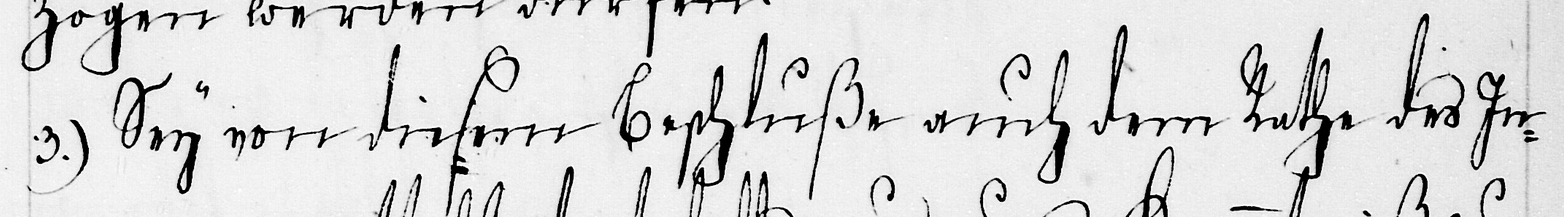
3.) Sey von diesem Beschluße auch dem Rathe des In¬
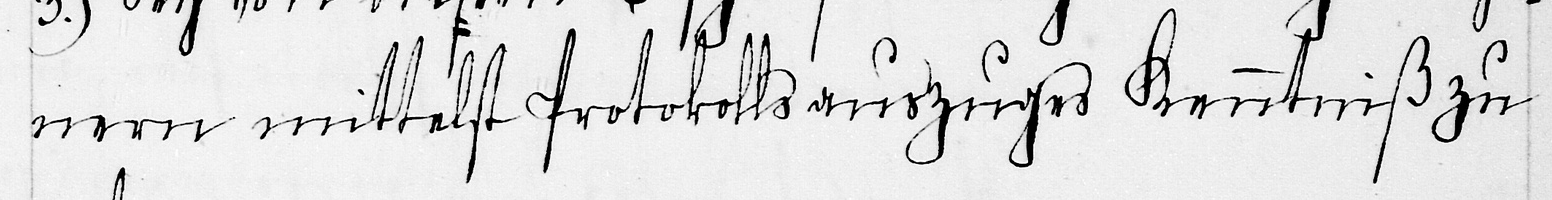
nern mittelst Protokollsauszuges Kenntniß zu
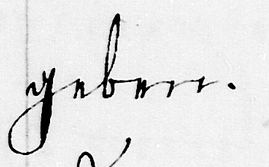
geben.
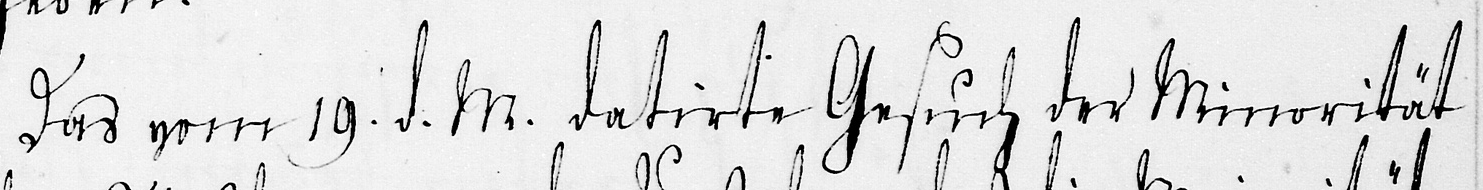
Das vom 19. d. M. datirte Gesuch der Minorität
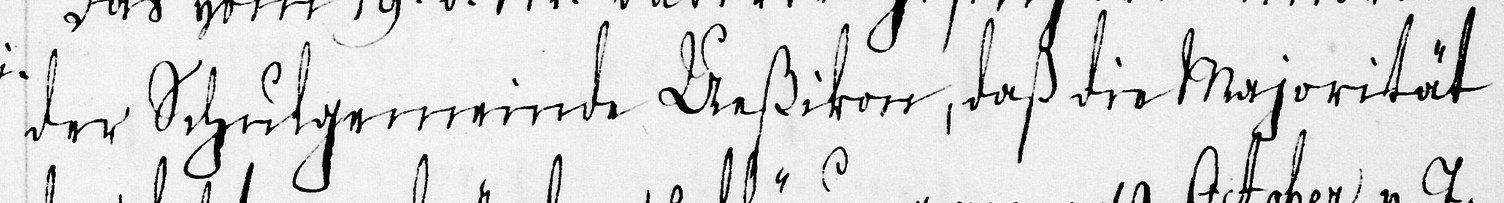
der Schulgemeinde Ueßikon, daß die Majorität
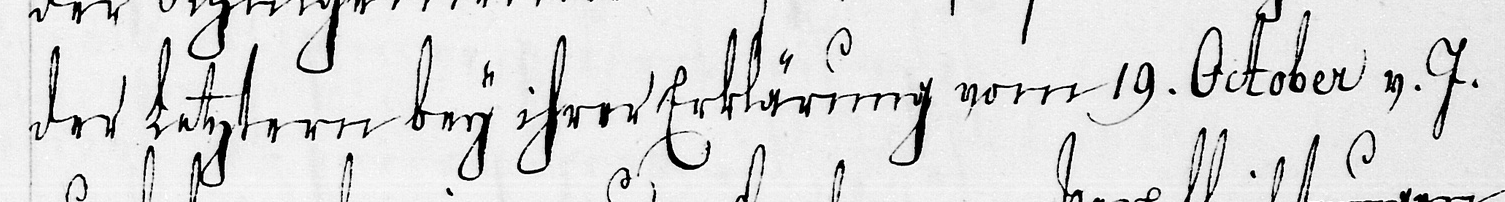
der Letztern bey ihrer Erklärung vom 19. October v. J.
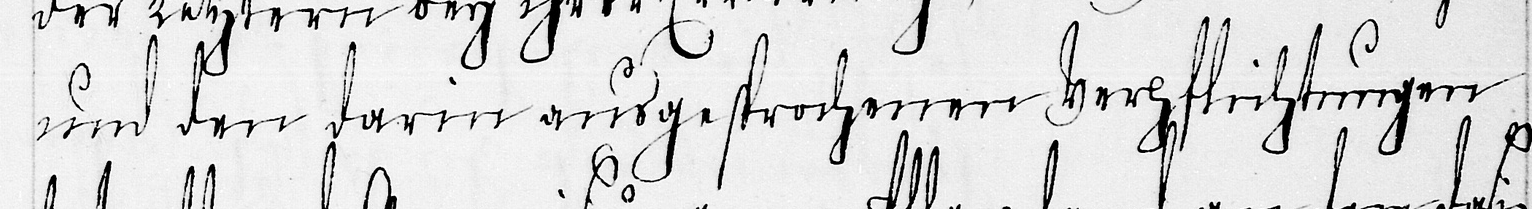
und den darin ausgesprochenen Verpflichtungen
